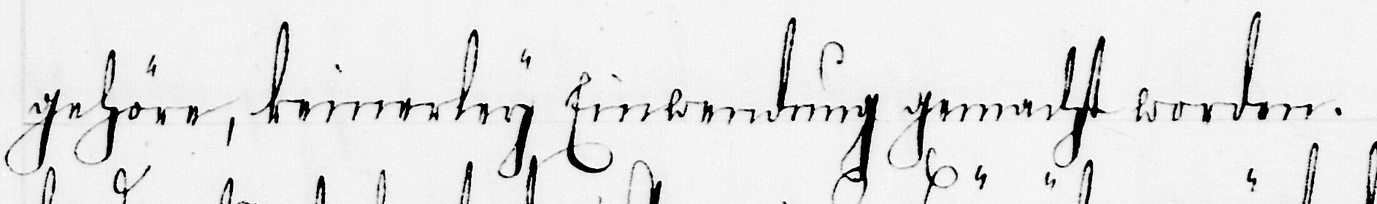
gehöre, keinerley Einwendung gemacht worden.
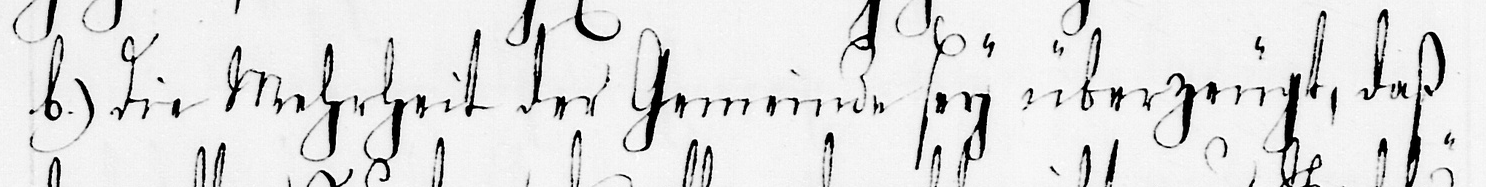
b.) Die Mehrheit der Gemeinde sey überzeugt, daß
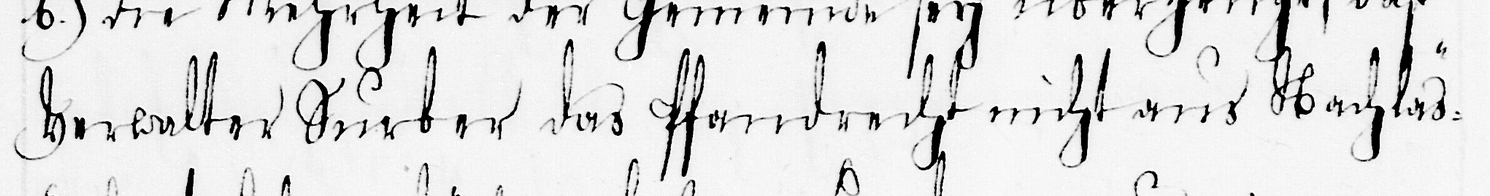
Verwalter Surber das Pfandrecht nicht aus Nachläß¬
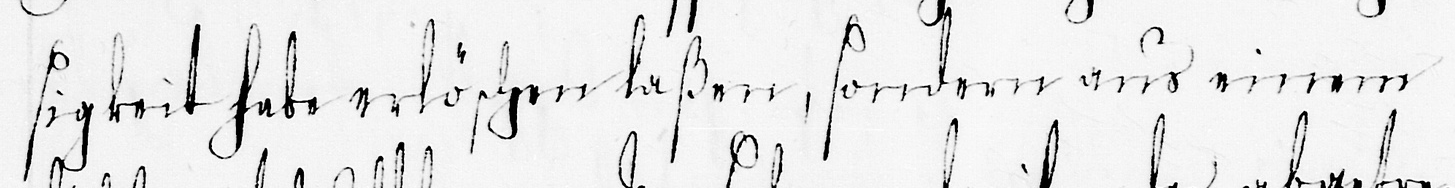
igkeit habe erlöschen laßen, sondern aus einem
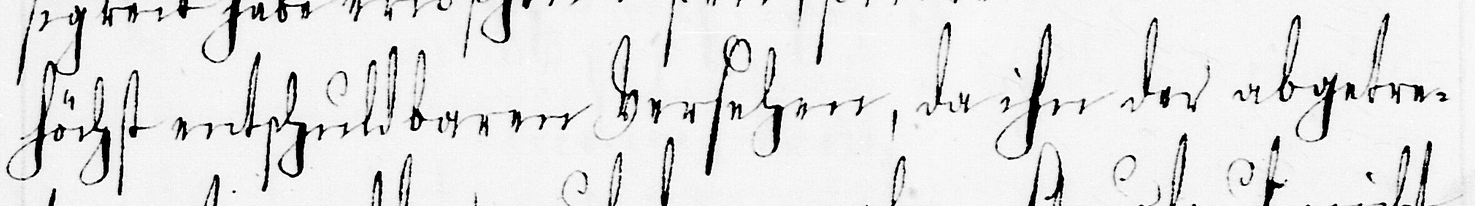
höchst entschuldbaren Versehen, da ihn der abgetre¬
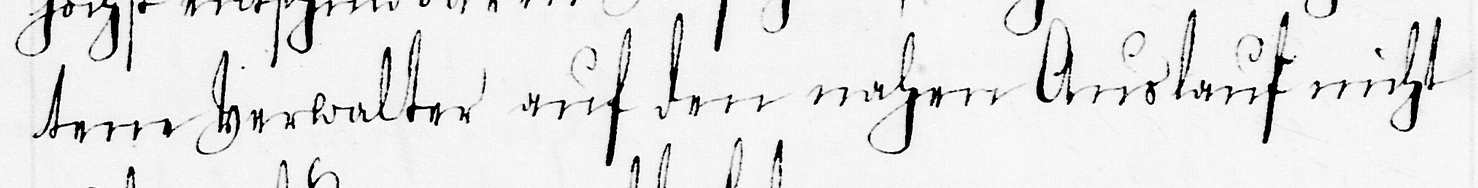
tene Verwalter auf den nahen Auslauf nicht
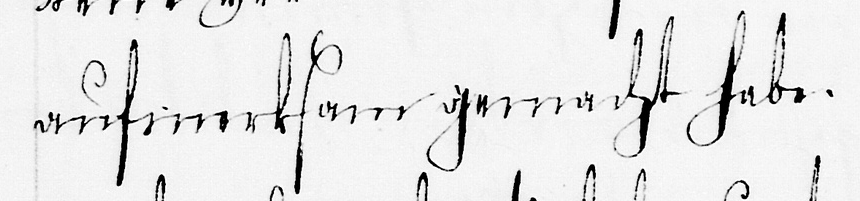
aufmerksam gemacht habe.
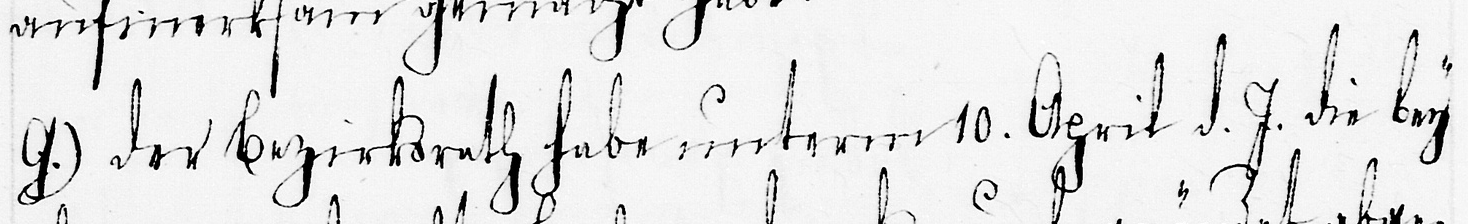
G.) Der Bezirksrath habe unterm 10. April d. J. die bey
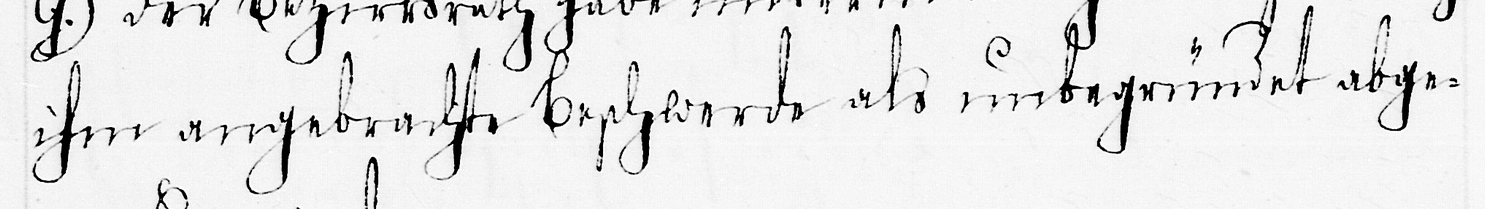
ihm angebrachte Beschwerde als unbegründet abge¬
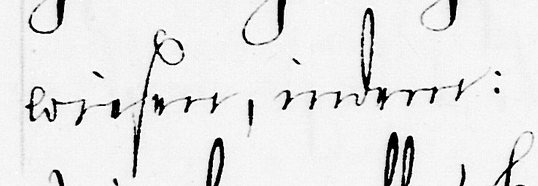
wiesen, indem:
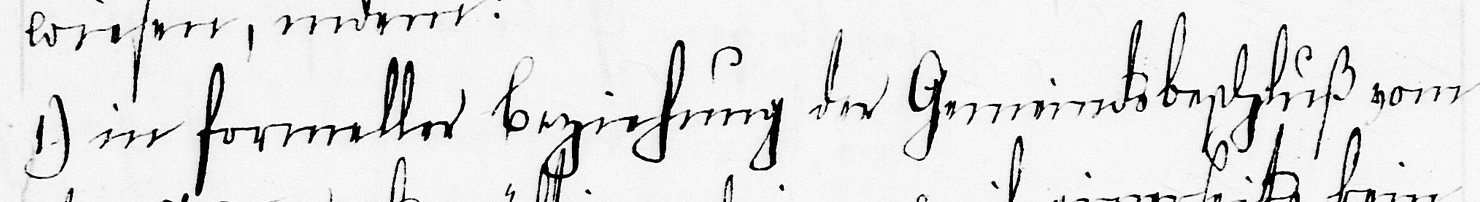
1.) in formeller Beziehung der Gemeindsbeschluß vom
